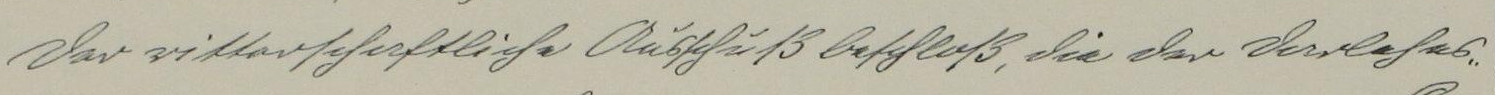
Der ritterschaftliche Ausschuß beschloß, die der Darlehns-
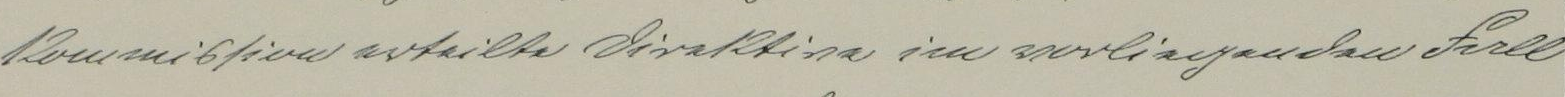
kommission erteilte Direktive im vorliegenden Fall
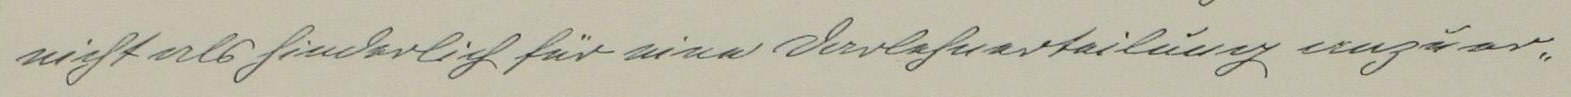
nicht als hinderlich für eine Darlehnerteilung anzuer-
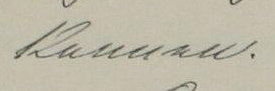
kennen.
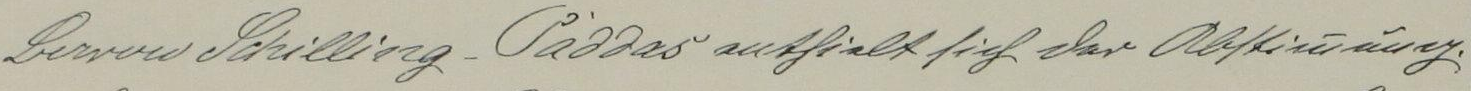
Baron Schilling-Paddas enthielt sich der Abstimmung.
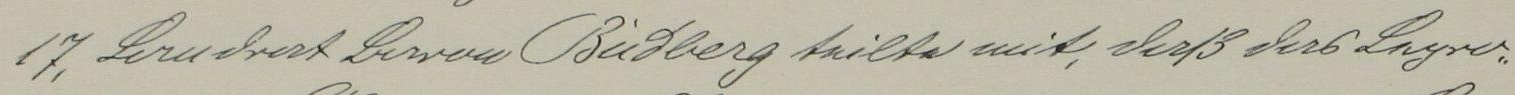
17. Landrat Baron Budberg teilte mit, daß das Lepro-
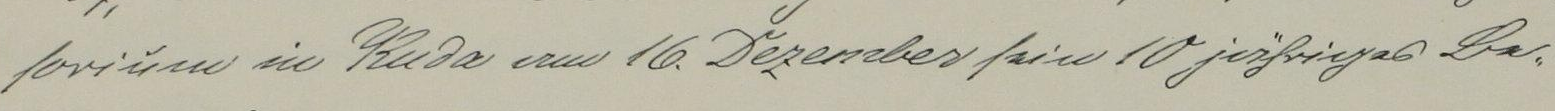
sorium in Kuda am 16. Dezember sein 10jähriges Be-
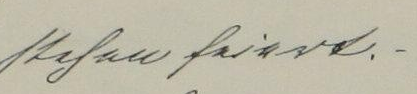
stehen feiert.
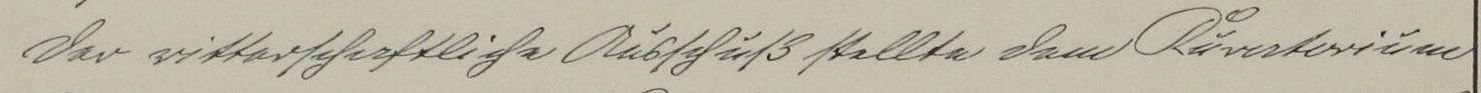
Der ritterschaftliche Ausschuß stellte dem Kuratorium
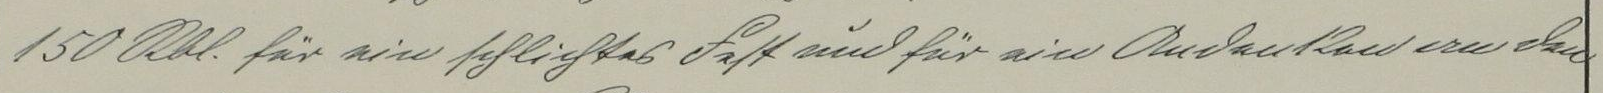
150 Rbl. für ein schlichtes Fest und für ein Andenken an den
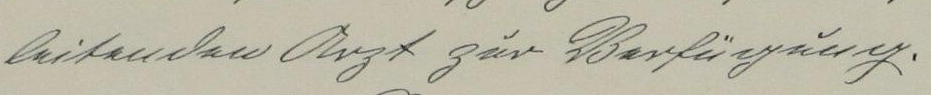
leitenden Arzt zur Verfügung.
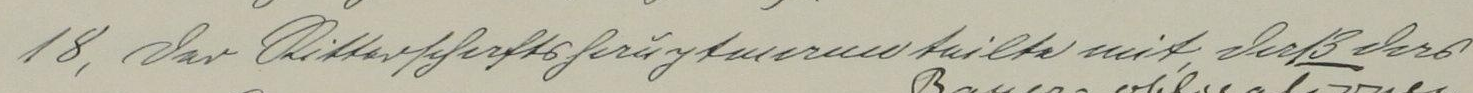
18. Der Ritterschaftshauptmann teilte mit, daß das
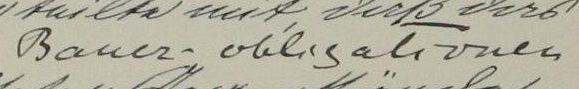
Bauer-obligationen
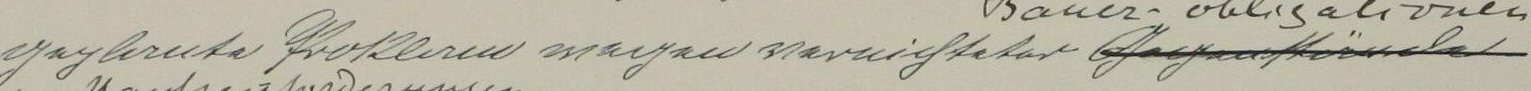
geplante Proklam wegen vernichteter Gegenstände
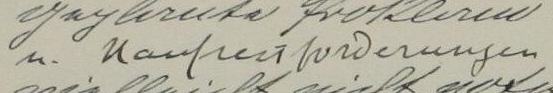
u. Kaufrestforderungen
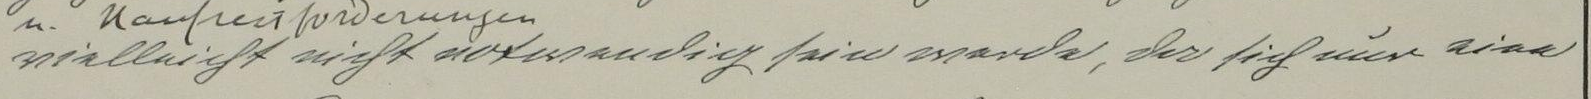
vielleicht nicht notwendig sein werde, da sich nur eine
